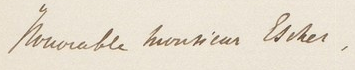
Honorable Monsieur Escher,
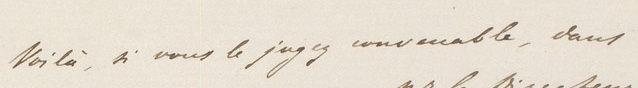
Voilà, si vous le jugez convenable, dans
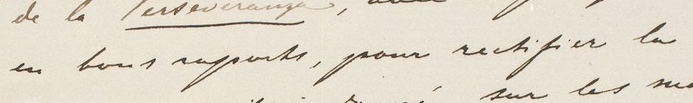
en tous raports, pour rectifier la
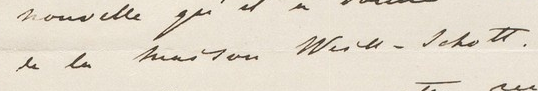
de la maison Weill-Schott.
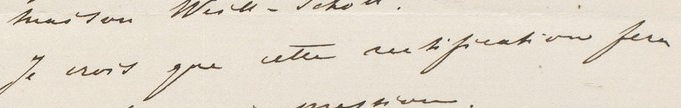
Je crois que cette rectification fera
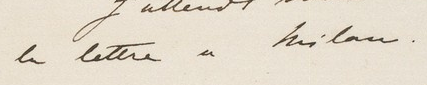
la lettre a Milan.
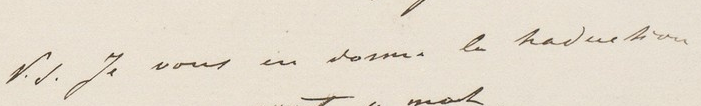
P. S. Je vous en donne la traduction
